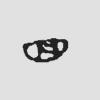四
